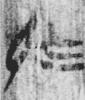於
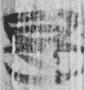是
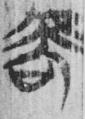唬（乎）
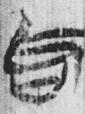○（始）
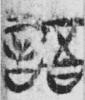語
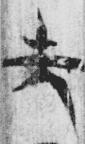○（堯）
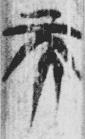天
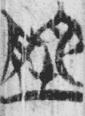○（地）
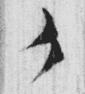人
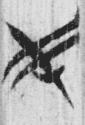民
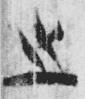之
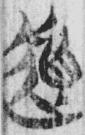道
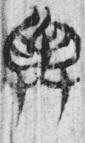與
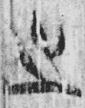之
